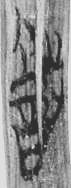○（察）
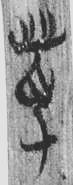○（一）
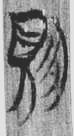則
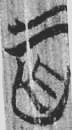百
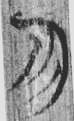勿（物）
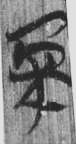不
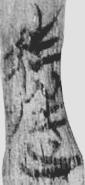○（失）
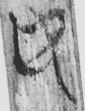女（如）
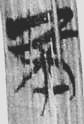不
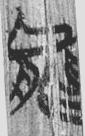能
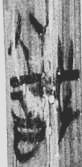○（察）
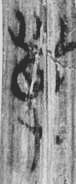○（一）
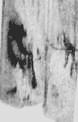則
